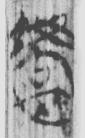{虎口戈}
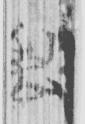殺
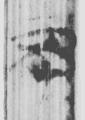不
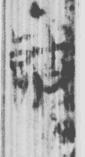{歺古}
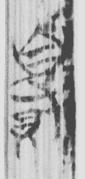{貝辠}
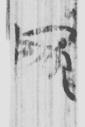戾
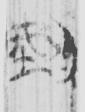型
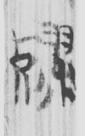{歺翏}
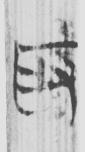取
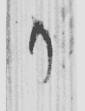人
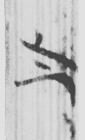之
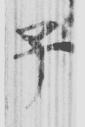子
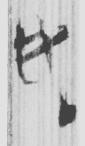女
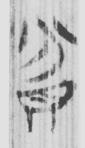貧
